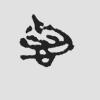德
